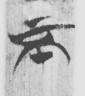不
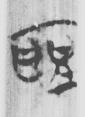聖
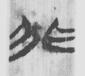非
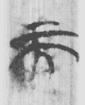天
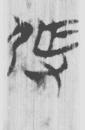{尸拃}
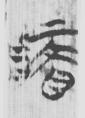{並文目}
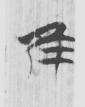隹
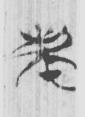民
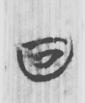昌
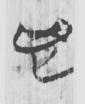兇
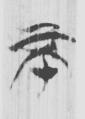不
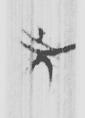{止人}
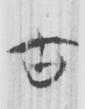古
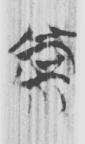常
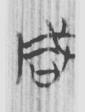咸
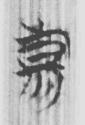{㫃昜}
